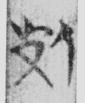死
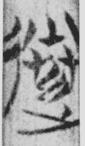{辶絭}
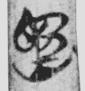{矛山}
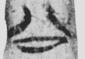公
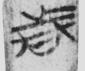者
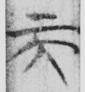天
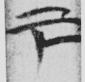下
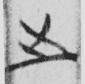之
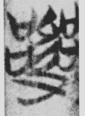○（亂）
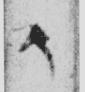人
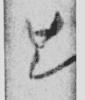也
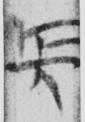長
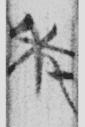年
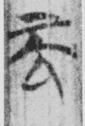而
